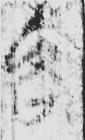客
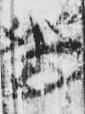○（發）
